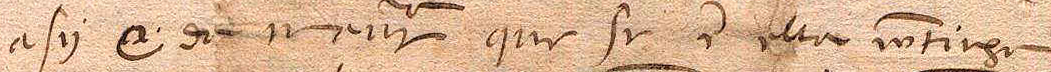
asy e da manrra que se ē ella c̄otinha
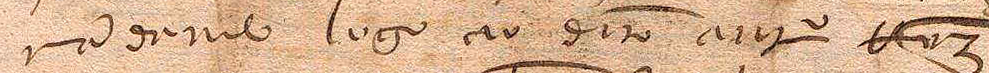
mādando logo ao dito anto Rōiz
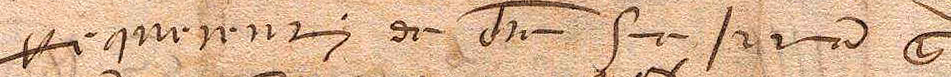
Requerente da d̄ta sua Jrmā q̄
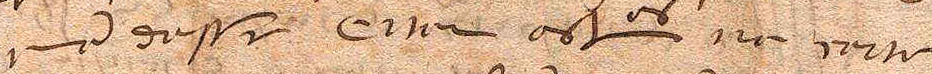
mādasse citar as tas na carta
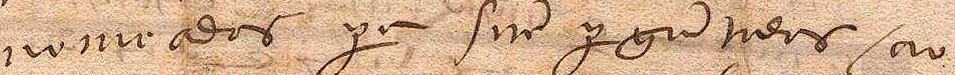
nomeadas ꝑa serē ꝑgūtadas / ao
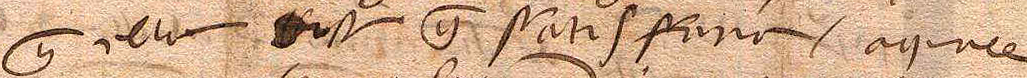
q̄ elle _ise q̄ satisfaria / a quall
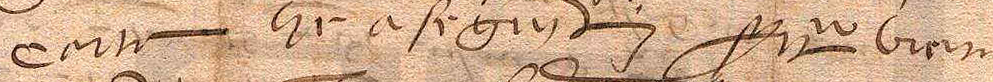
carta he a segūjte frrco vieira
